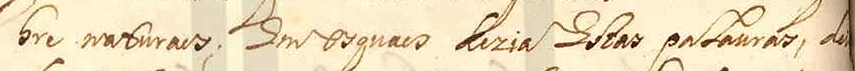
brenaturaes, Em os quaes dezia Estas palauras, de
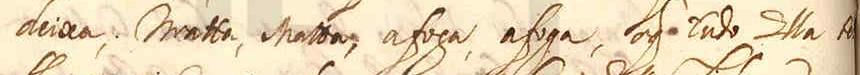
deixa, Matta, Matta, afoga, afoga, o q̄ tudo Ella te
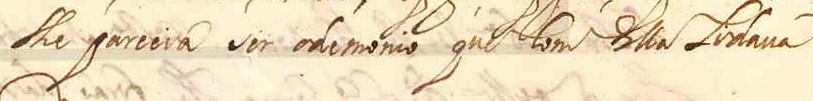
lhe parecia ser o demonio que Com Ella Lidaua
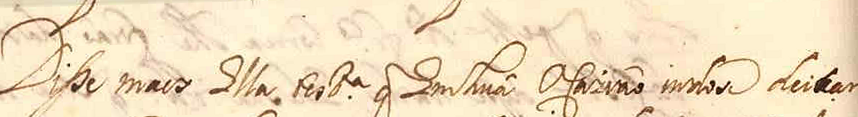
Disse mais Ella test.a q̄ Em huā OCaziaõ indose deitar
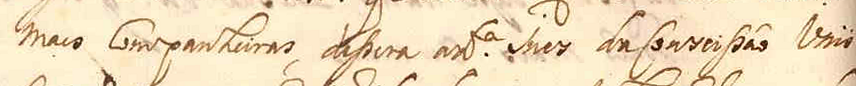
mais Companheiras, dissera a d.a Ines da Conseissão Vnis
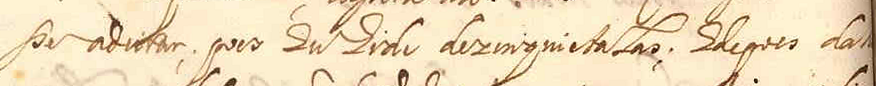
sse adeitar, poes Eu Eide dezinquietalas, E depoes da
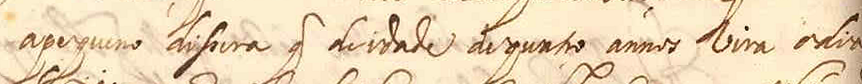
a pequeno dissera q̄ de idade de quatro annos vira o dia
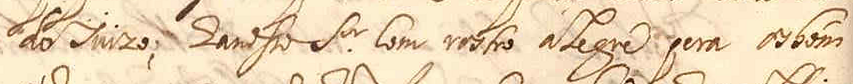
do Iuizo, E a nosso S.or Com rostro alegre pera os bons
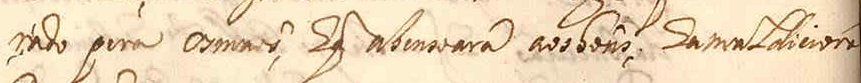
rado pera os maos, E q̄ abensoara aos bons, E amaldiciora
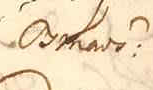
Os maos.
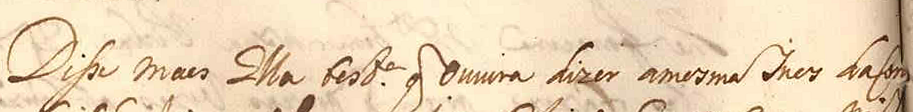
Disse maes Ella test.a q̄ ouuira dizer a mesma Ines da Con
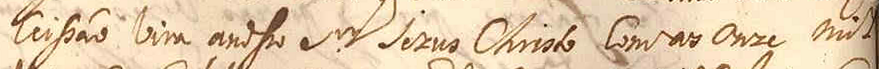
Ceissaõ vira a nosso s.or Iezus Christo com as onze mil
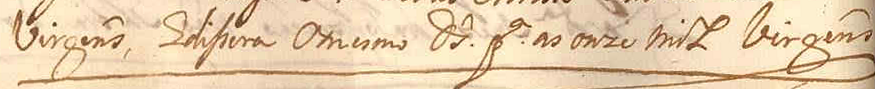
Virgens, E dissera O mesmo Ds̄ p.a as onze mil Virgens
